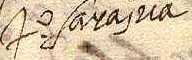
J.o Sarajua
